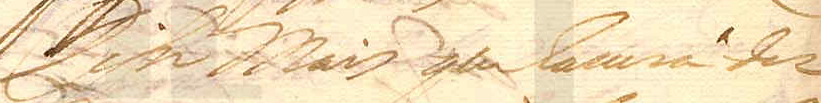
Disse Mais que hauerá dez
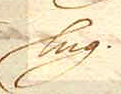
Lug.
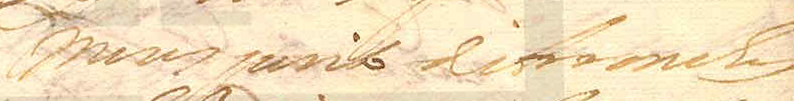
Mezes junto de Arronches
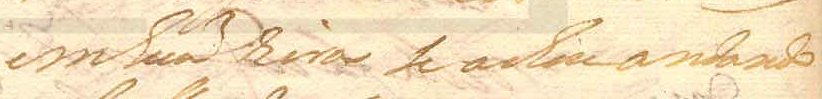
em huā Eira se achou andando
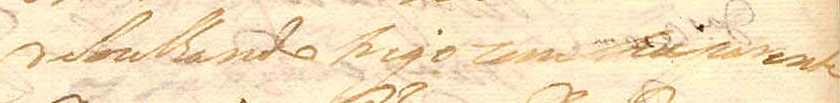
debulhando trigo com seu parente
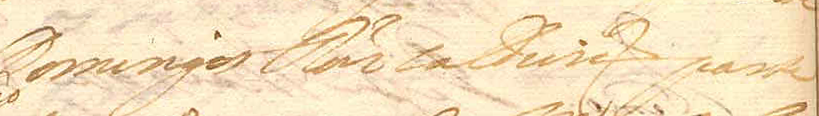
Domingos Roiz̄ caldeiraõ parte
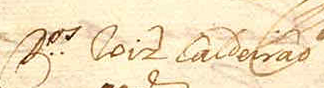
D.os Roiz̄ Caldeiraõ
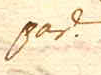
par.e
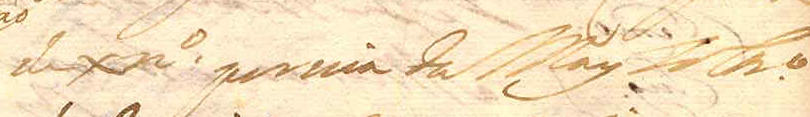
de x no. por uia da May soltr.o
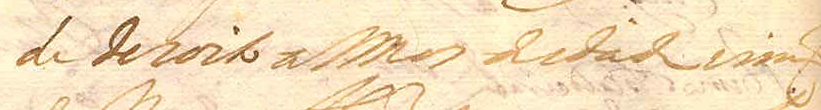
de dezoito annos didade irmaõ
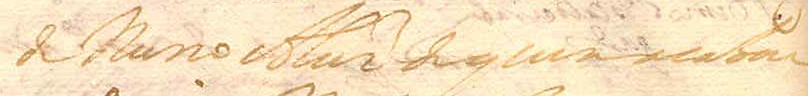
de Nuno Aluz̄ de quem acabou
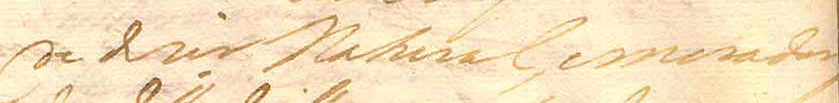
de dizer natural, e morador
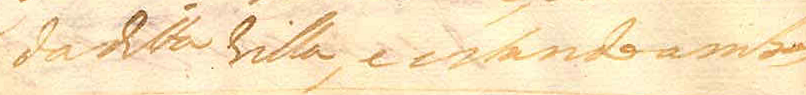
da ditta Villa, e estando ambos
